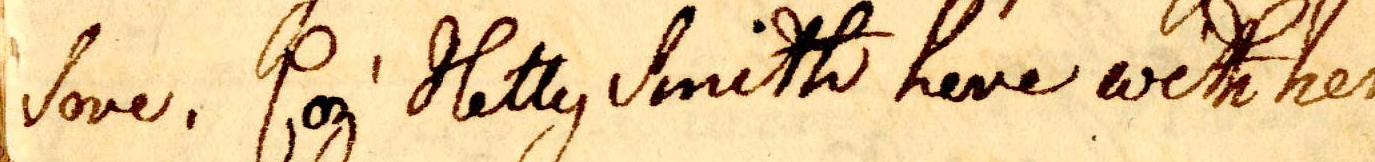sore, Coz Hetty Smith have with her
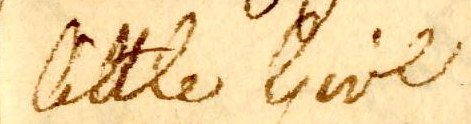little Girl
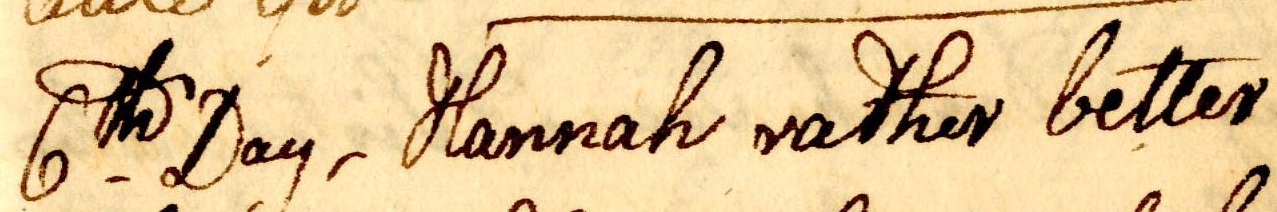6^th Day- Hannah rather better
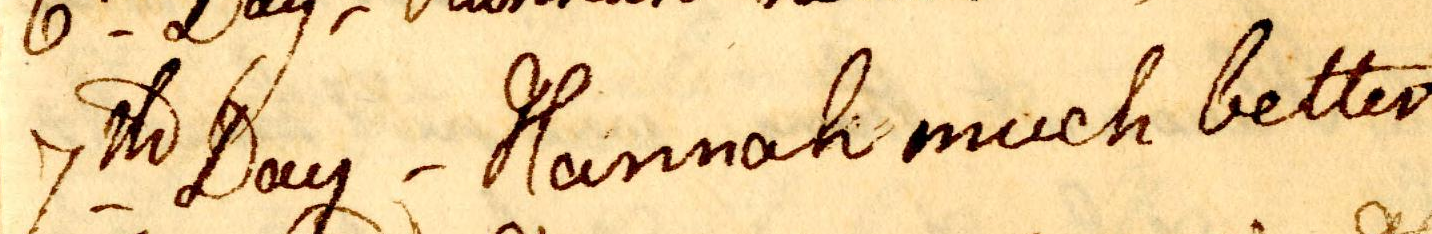7^th Day- Hannah much better
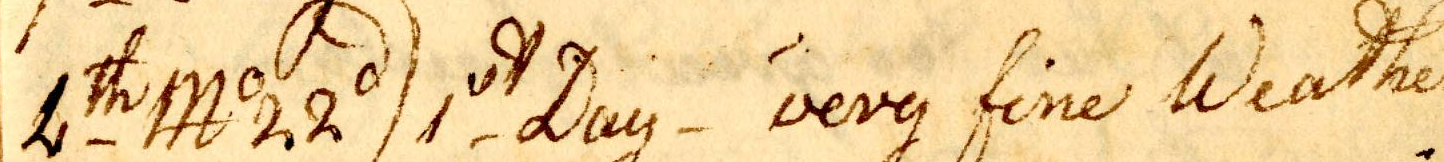4^th M^o 22^d) 1^st Day- very fine Weather
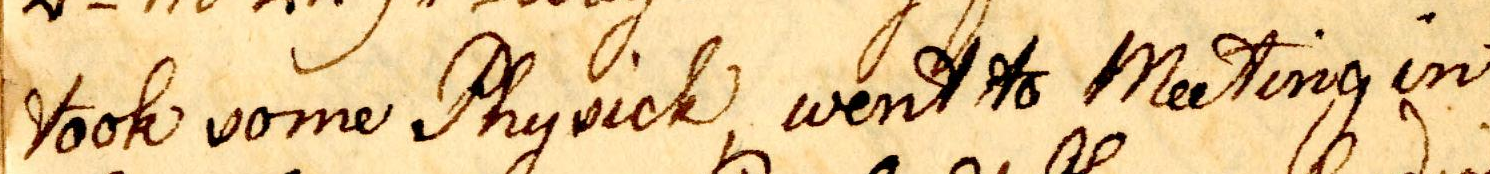took some Phsyick, went to Meeting in
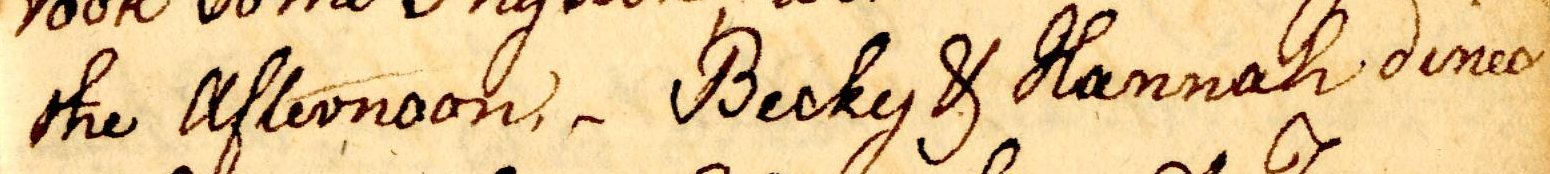the Afternoon, Becky & Hannah dined
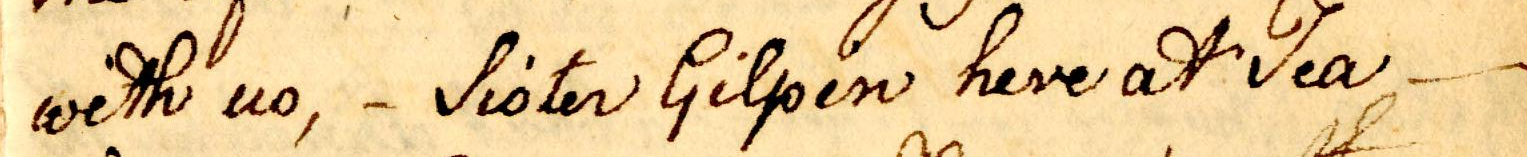with us,- Sister Gilpin here at Tea-
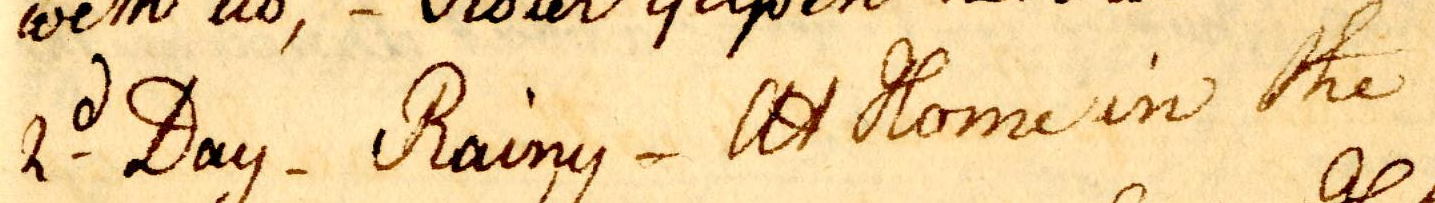2^d Day- Rainy- At Home in the
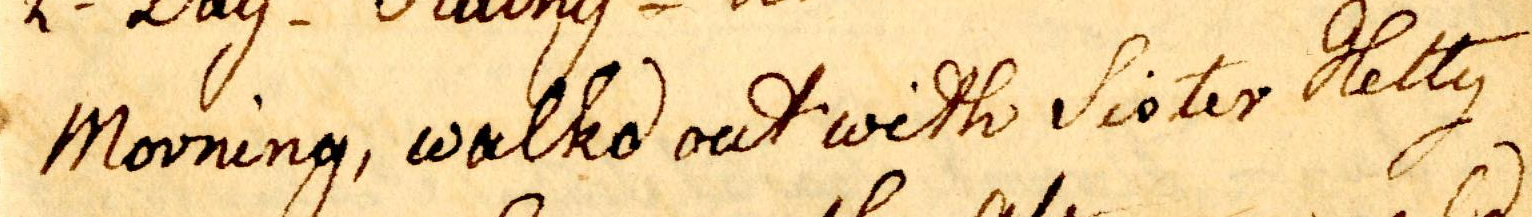Morning, walkd out with Sister Hetty
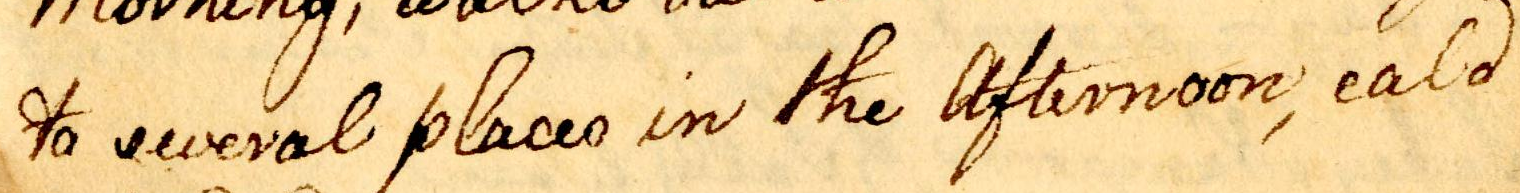to several places in the Afternoon, cald
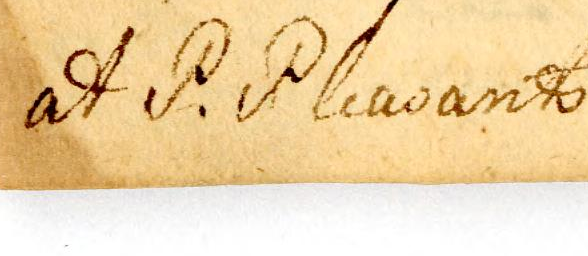at P. Pleasants
